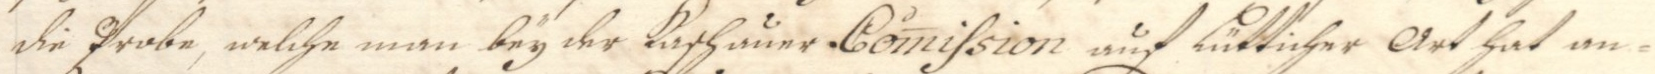die Probe, welche man bey der Kaschauer Commission auf Lütticher Art hat an-
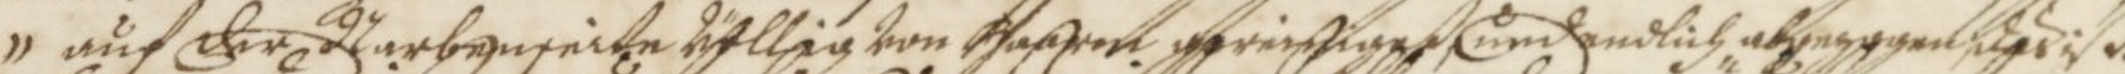auf der Narbenseite Völlig von Haaren gereiniget und endlich abgezogen, das ist:
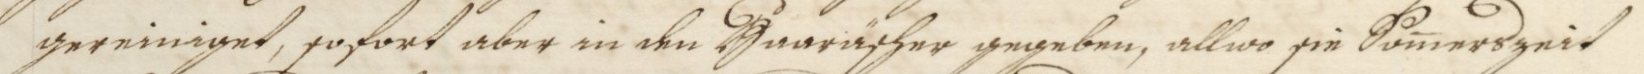gereiniget, sofort aber in den Haaräscher gegeben, allwo sie Sommerszeit
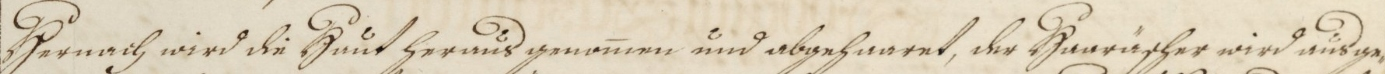Hernach wird die Haut heraus genommen und abgehaaret, der Haaräscher wird ausge-
